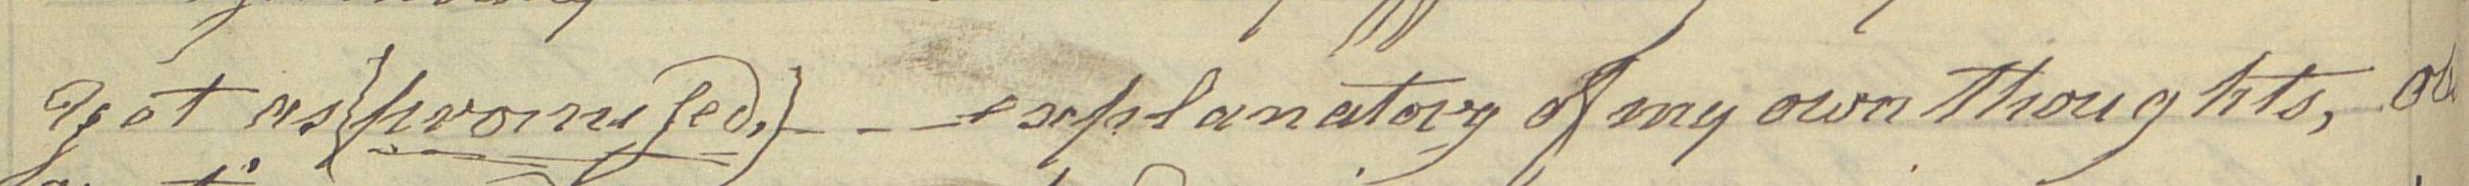yet as (promised,) explanatory of my own thoughts, ob-
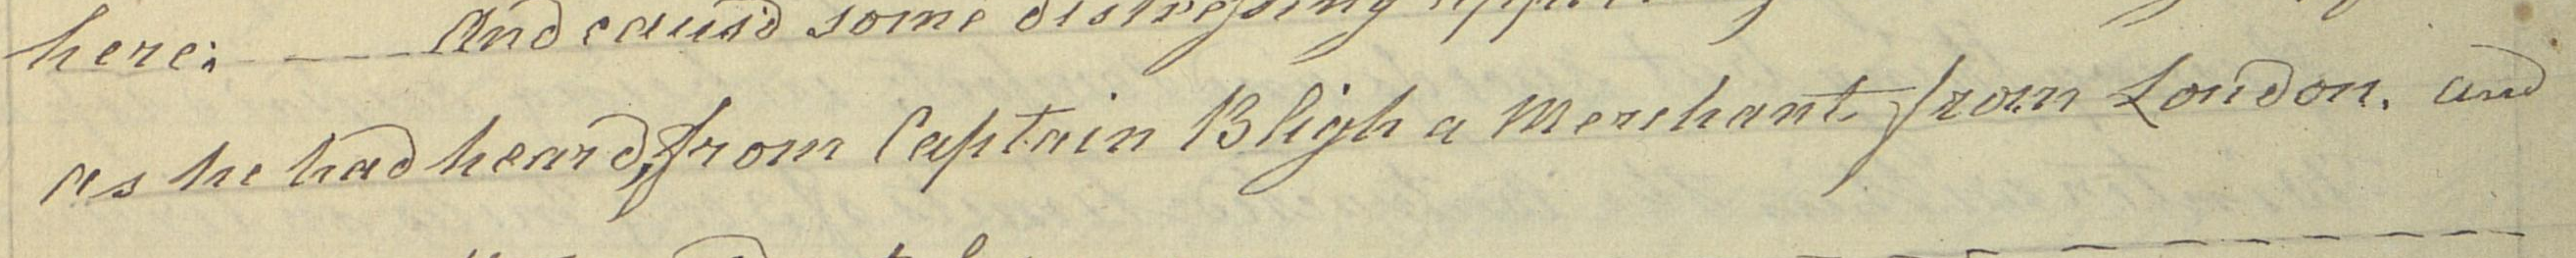as he had heard, from Captain Bligh a merchant from London, and
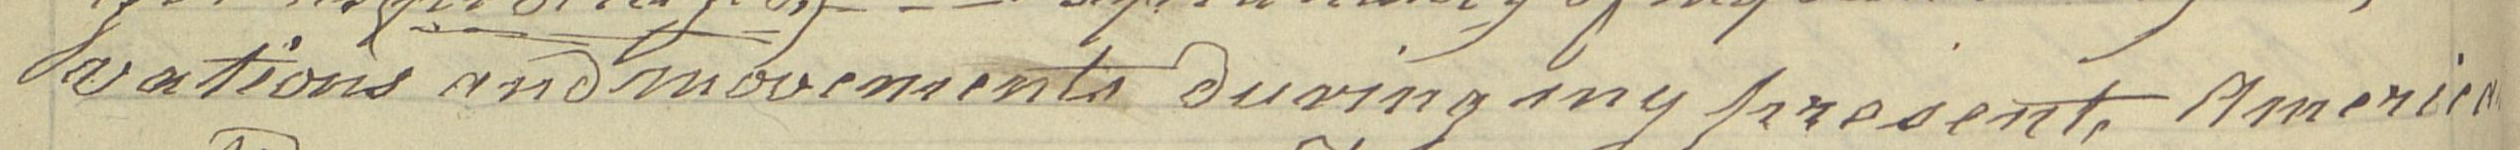-vations and moveents during my present America
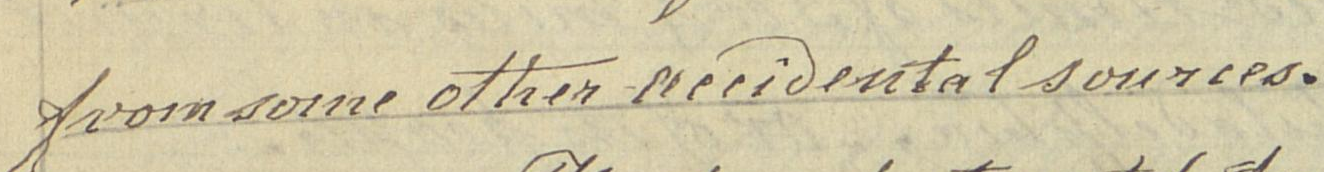from some other accidental sources.
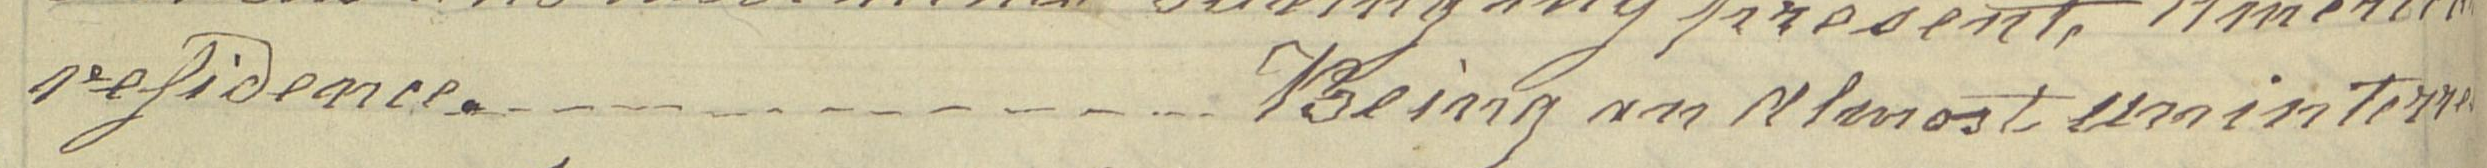residence. Being an almost uninterr-
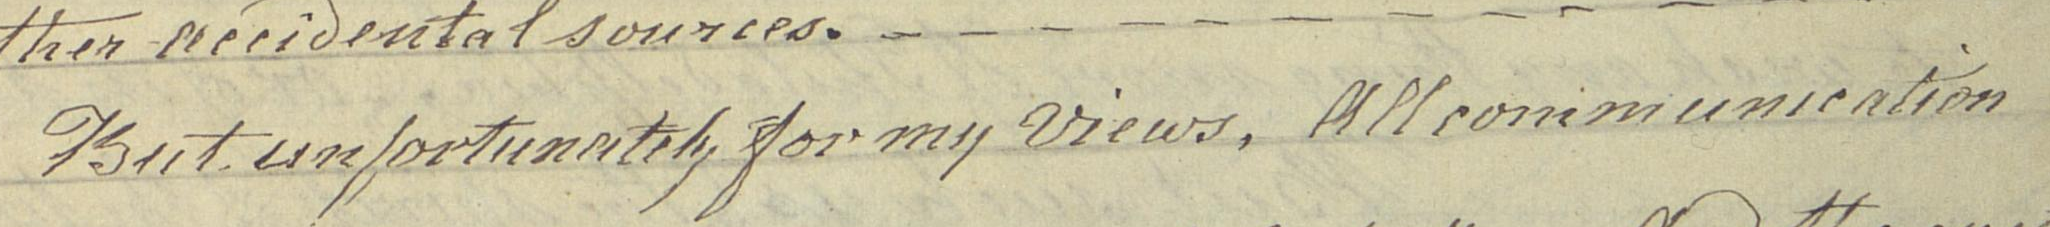But unfortunately for my views, all communication
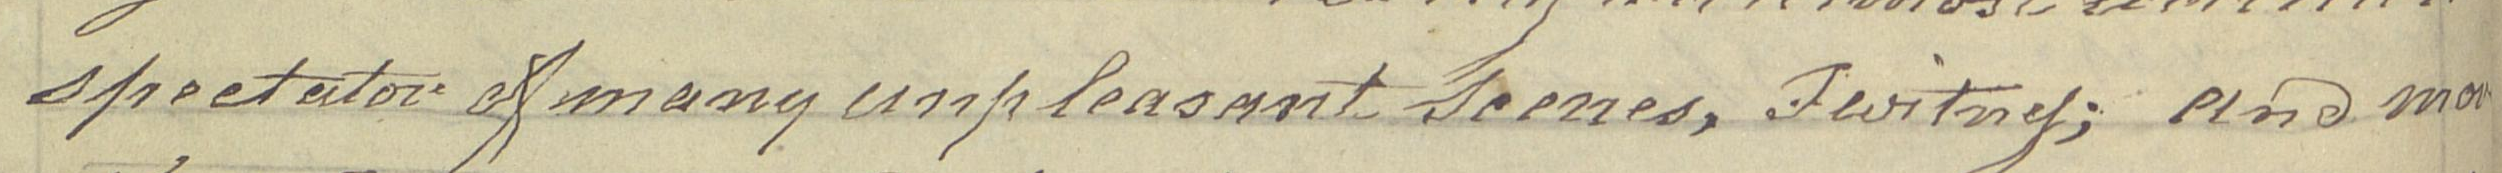spectator of many unpleasant scenes, Tartny; and mo-
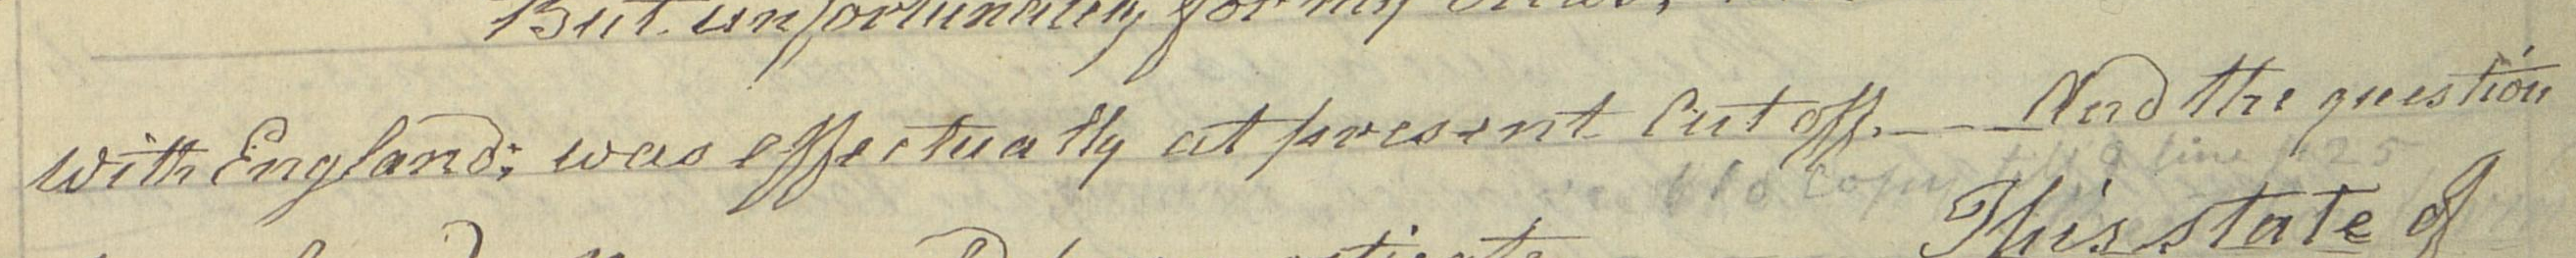with England; was effectually at present cut off. And the question
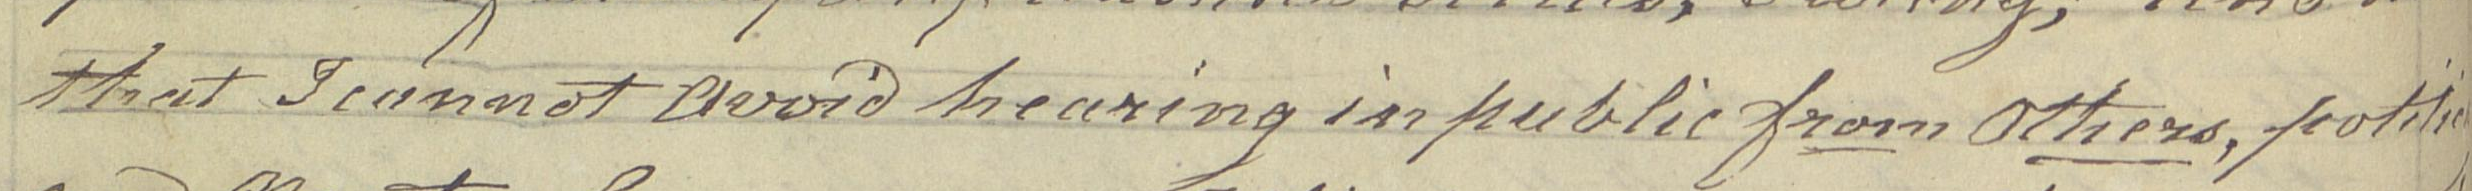that I cannot avoid hearing in public from others, political
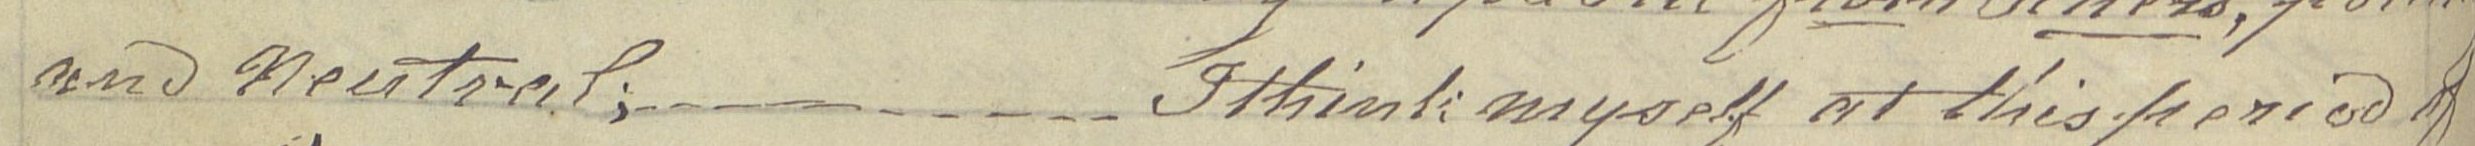and neutral; I think myself at this period of
